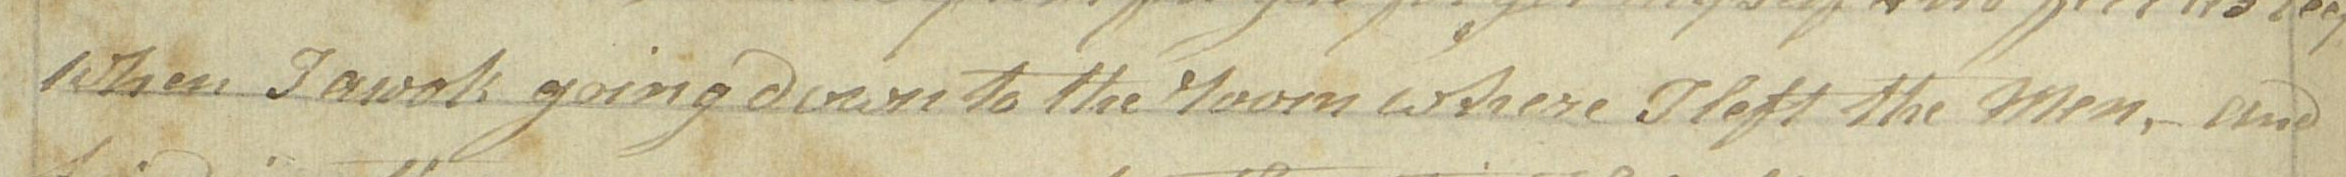When I awok going down to the Room where I left the Men, And
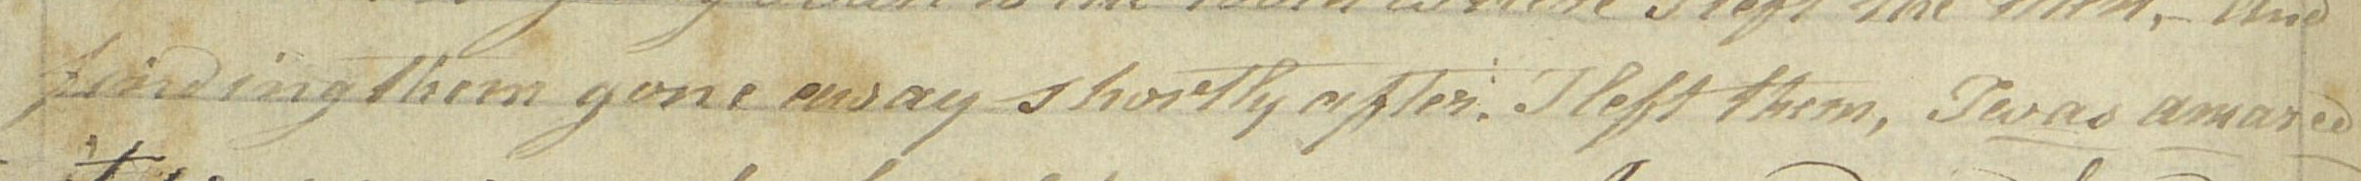finding them gone away shortly after. I left them, I was amazed
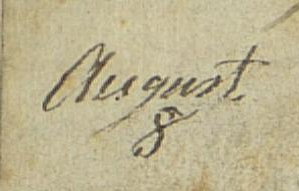August
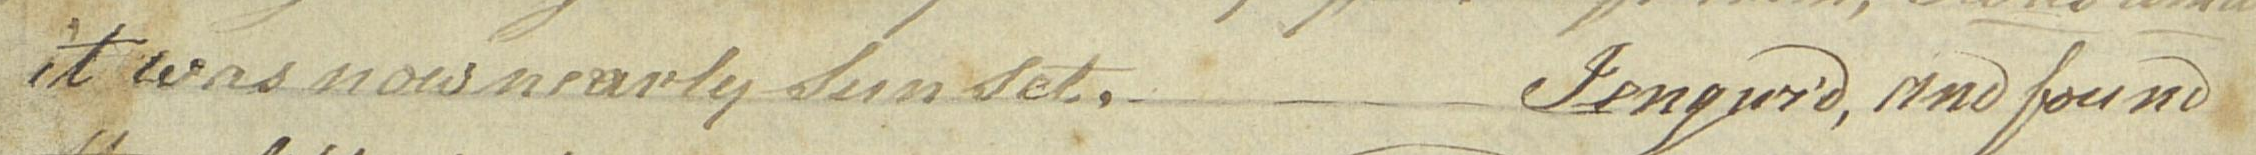it was now nearly Sunset, I enquir'd, and found
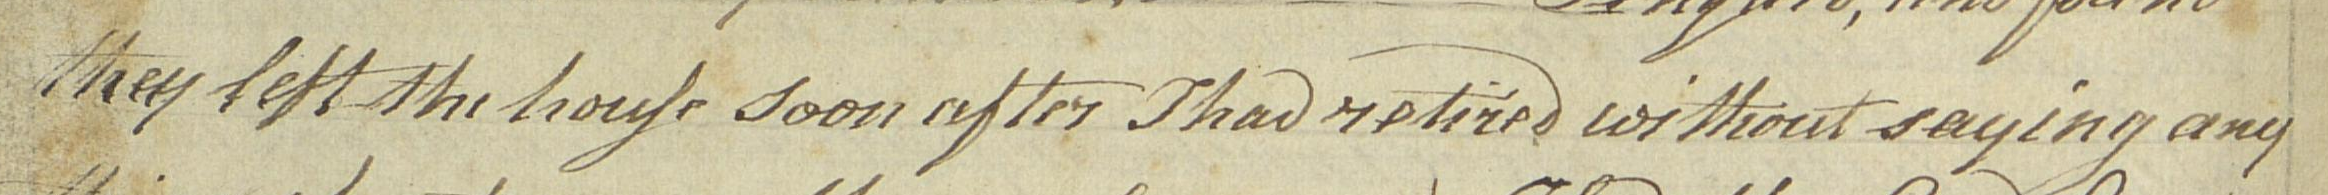they left the house soon after I had retired without saying any
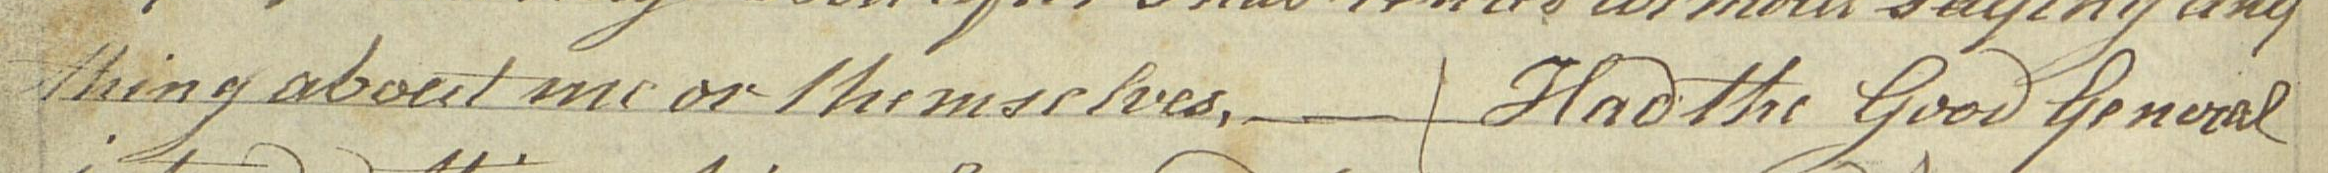thing about me or themselves. Had the Good General
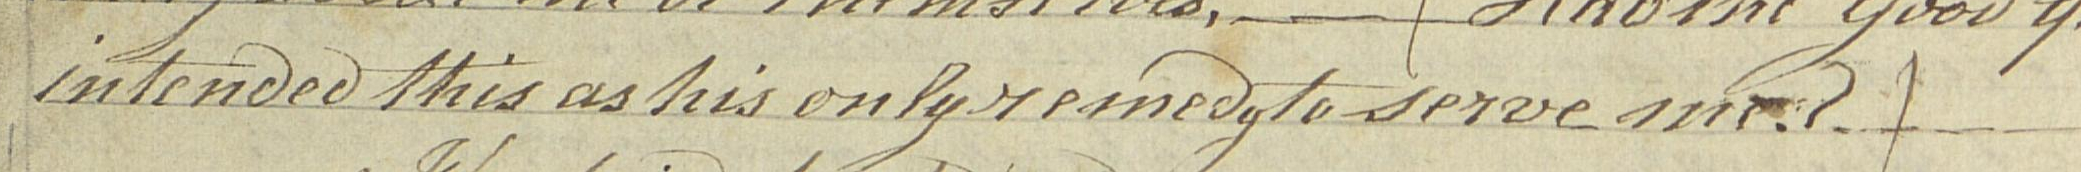intended this as his only remedy to serve me?
